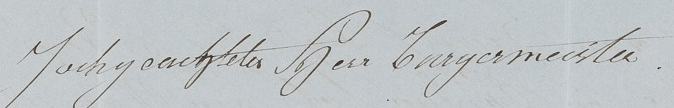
Hochgeachteter Herr Burgermeister!
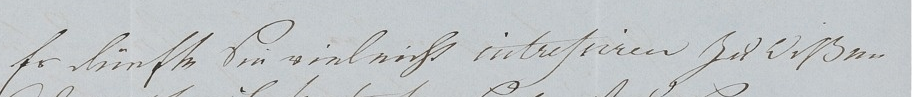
Es dürfte Sie vieleicht intressiren zu wißen
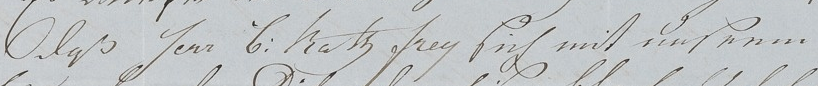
daß Herr B:Rath Frey sich mit unsrem
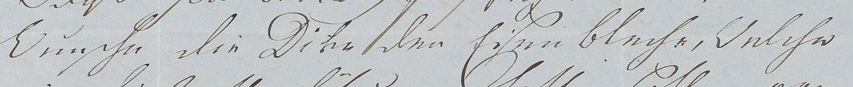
Wunsche die Dike der Eisen bleche, welche
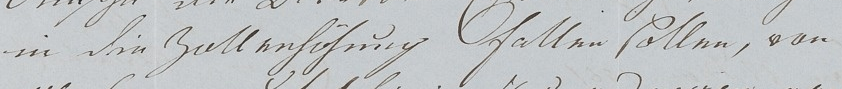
in die Zollerhöhung fallen sollen, von
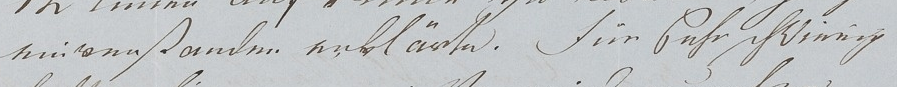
einverstanden erklärte. Für sehr schwierig
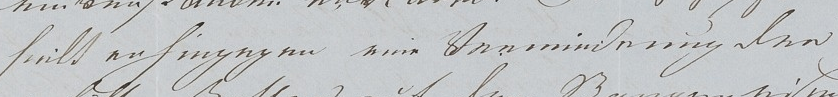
hielt er hingegen eine Verminderung des
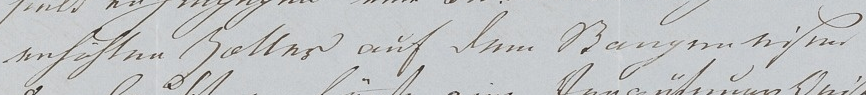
erhöhten Zolles auf dem Stangeneisen
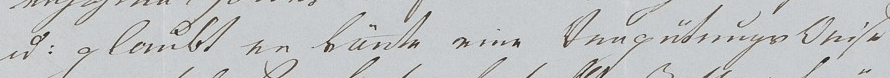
u: glaubt es könnte eine Vergütungsweise
